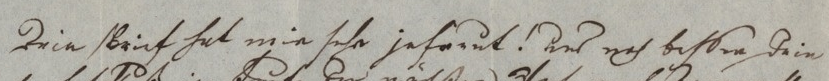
Dein Brief hat mir sehr jefreut! und noch besser Dein
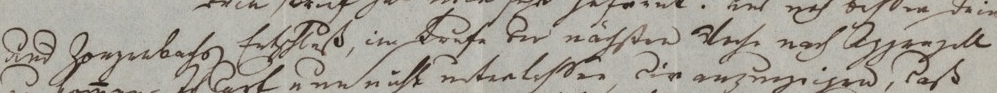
und Gonzenbachs Entschluß, im Laufe der nächsten Woche nach Appenzell
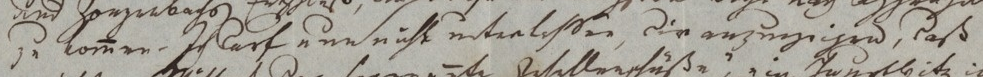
zu kommen. Ich darf nun nicht unterlassen, dir anzuzeigen, daß
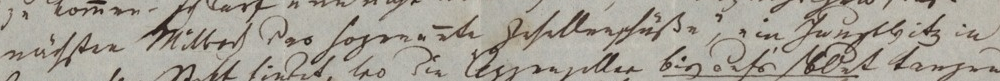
nächsten Mitwoch das sogenannte «Gesellenschüße», ein Hauptwitz in
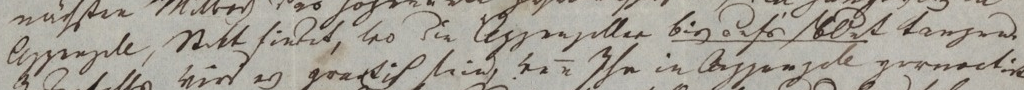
Appenzell, Statt findet, wo die Appenzellerbis auf's Blut tanzen.
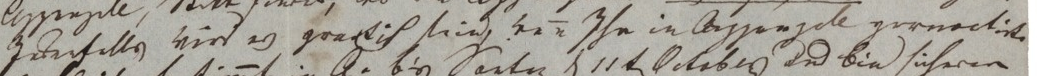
Jedenfalls wird es practisch sein, wenn Ihr in Appenzell pernoctirt.
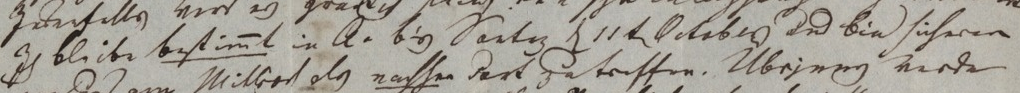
Ich bleibe bestimmt in A. bis Sontag den 11ten October und bin sicherer
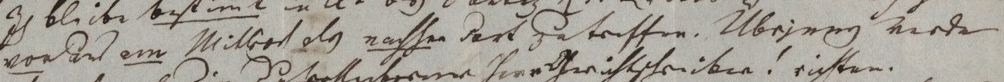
vor und amMitwoch als nachher dort zu treffen. Übrjens werde
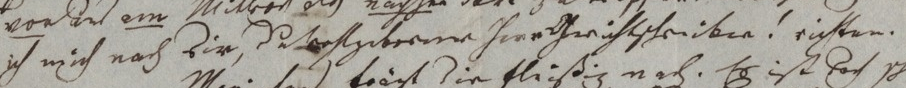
ich mich nach dir, Du wohlgeborner Herr Gerichtschreiber! richten.
